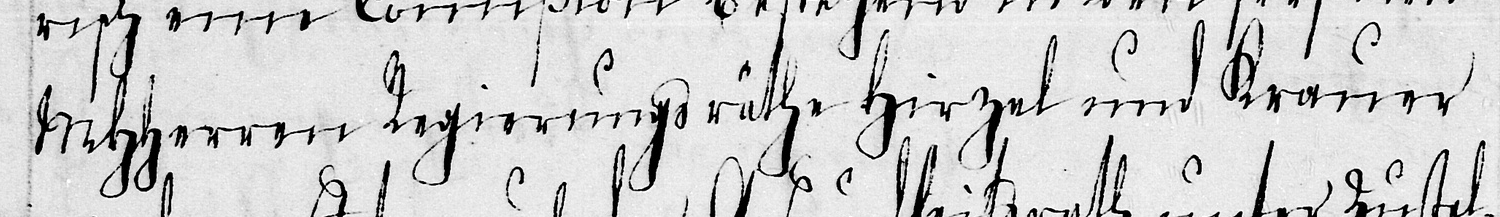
MHHerren Regierungsräthe Hirzel und Krauer
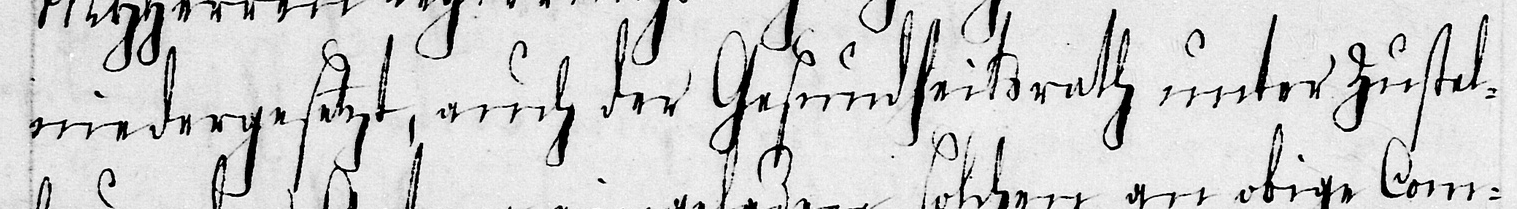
niedergesetzt, auch der Gesundheitsrath unter Zustel¬
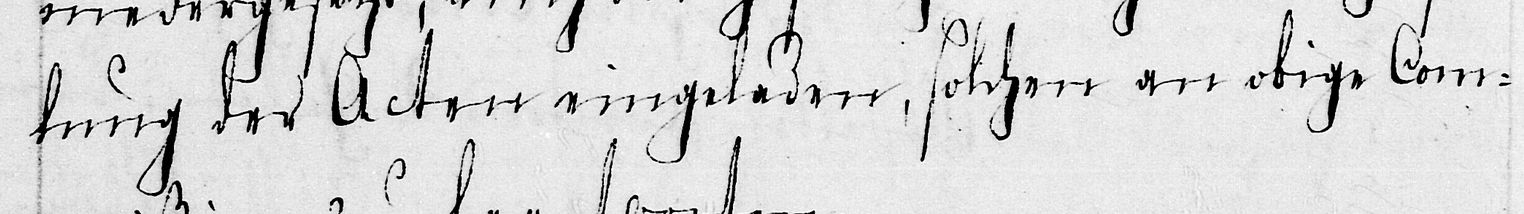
lung der Acten eingeladen, solchen an obige Com¬
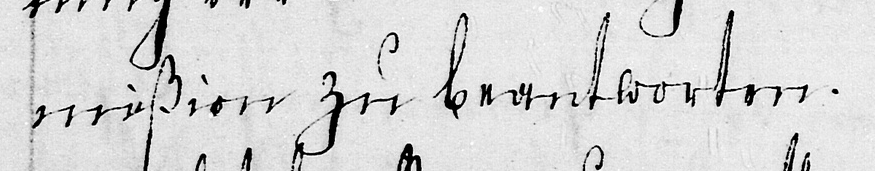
mißion zu beantworten.
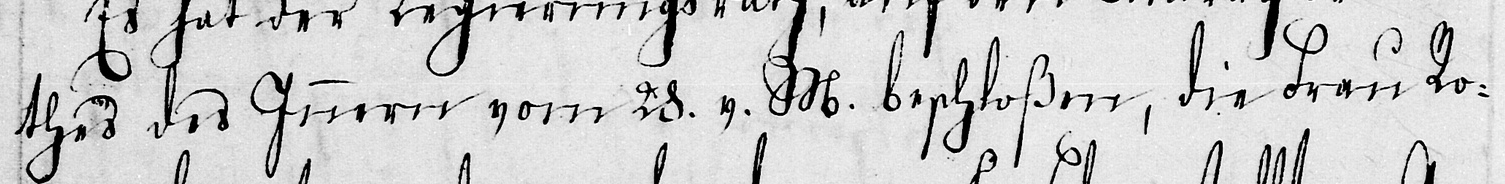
thes des Innern vom 28. v. M. beschloßen, die Frau Ros¬
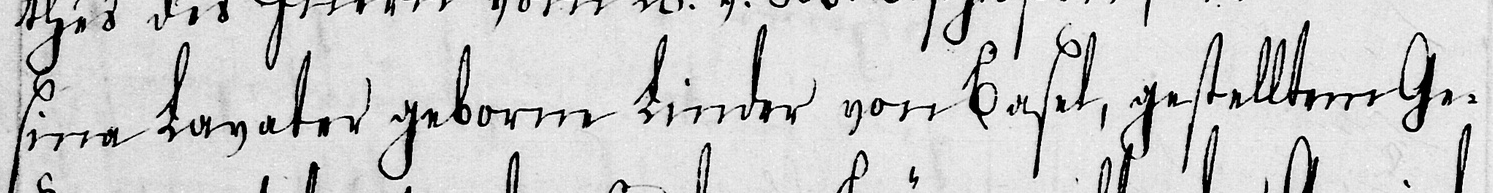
ina Lavater geborne Linder von Basel, gestelltem Ge¬
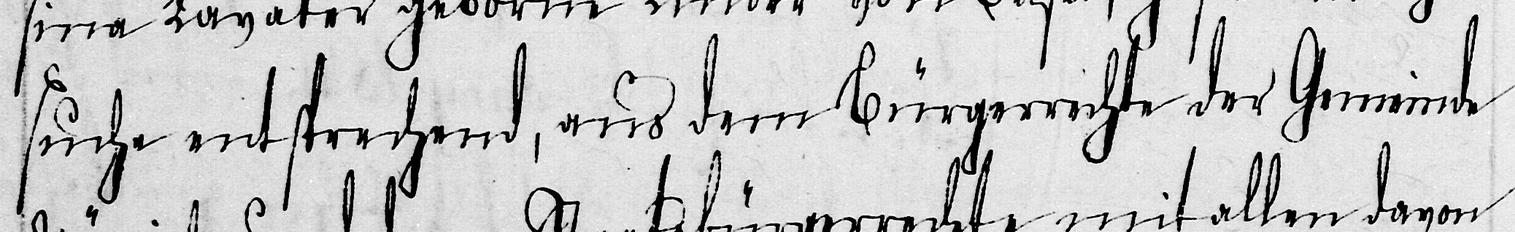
suche entsprechend, aus dem Bürgerrechte der Gemeinde
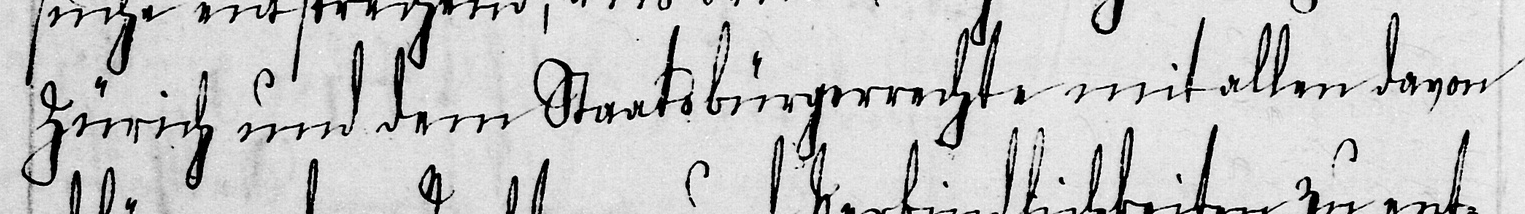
Zürich und dem Staatsbürgerrechte mit allen davon
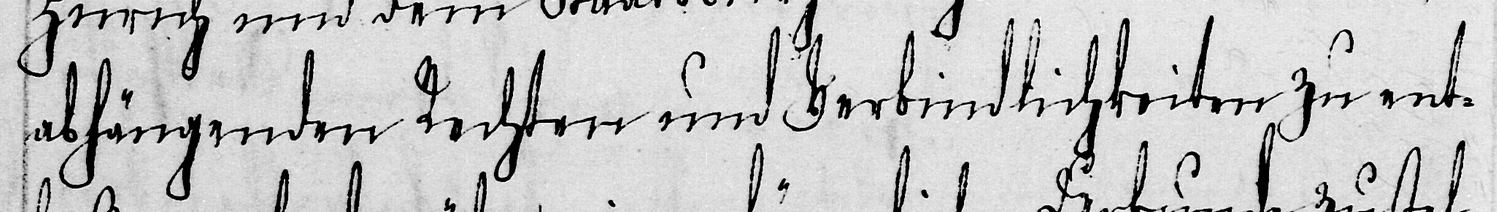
abhängenden Rechten und Verbindlichkeiten zu ent¬
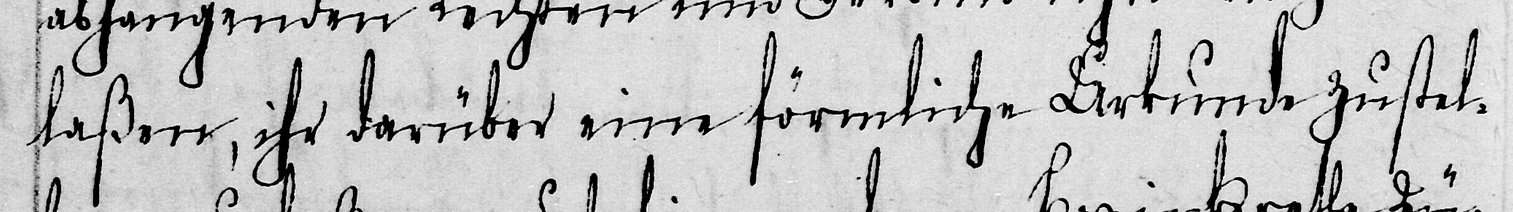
laßen, ihr darüber eine förmliche Urkunde zustel¬
